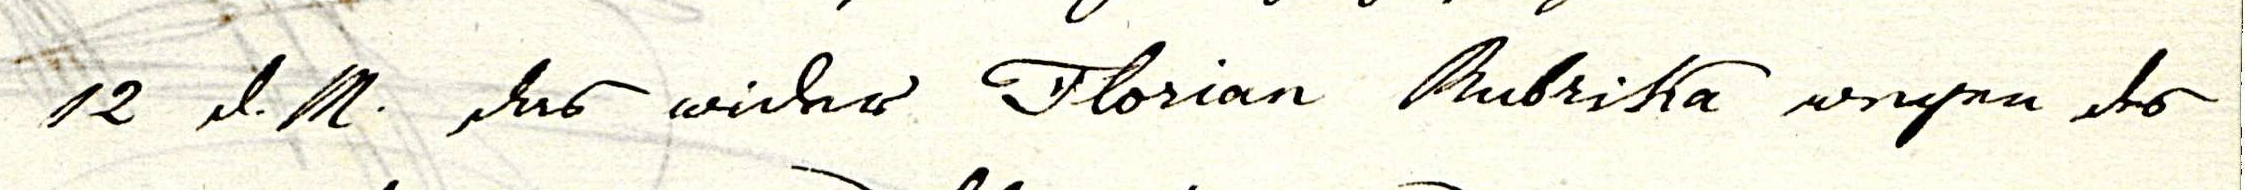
12 d. M. das wider Florian Rubrika wegen es
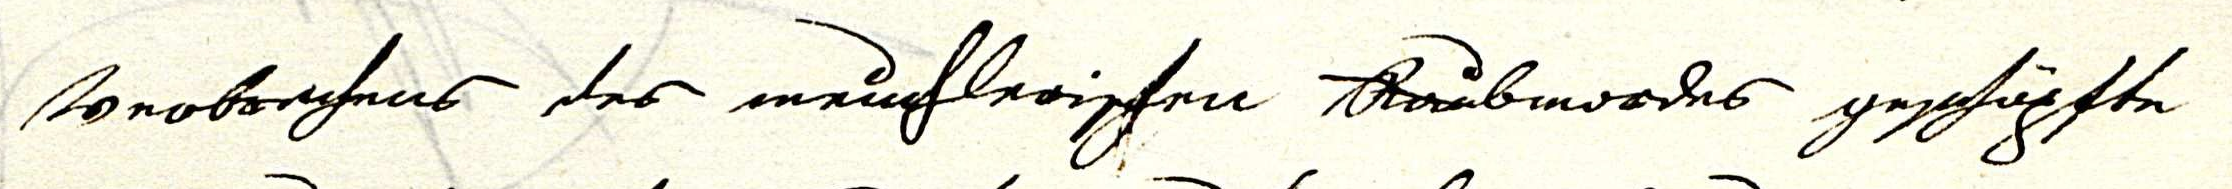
Verbrechens des meuchlerischen Raubmordes geschöpfte
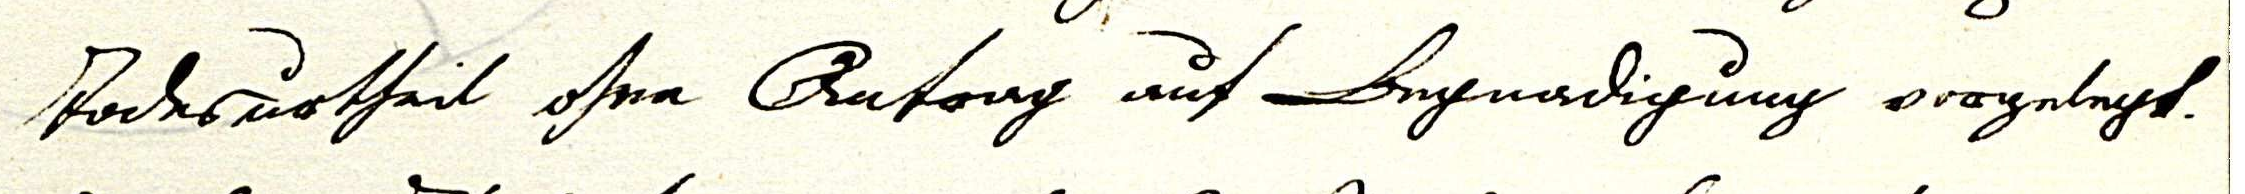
Todesurtheil ohne Antrag auf Begnadigung vorgelegt.
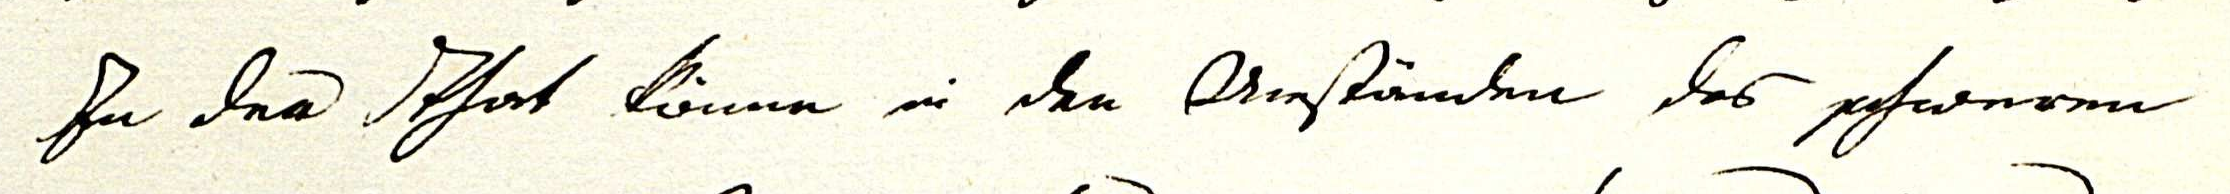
In der That könne in den Umständen des schweren
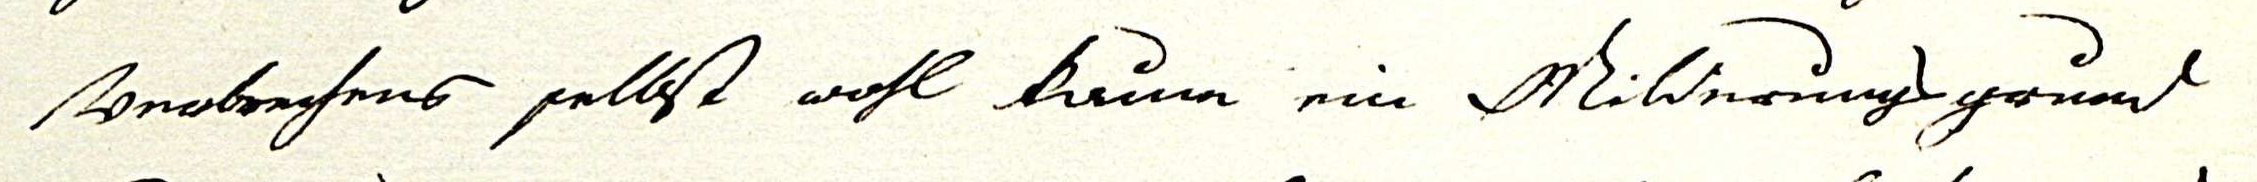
Verbrechens selbst wohl kaum ein Milderungsgrund
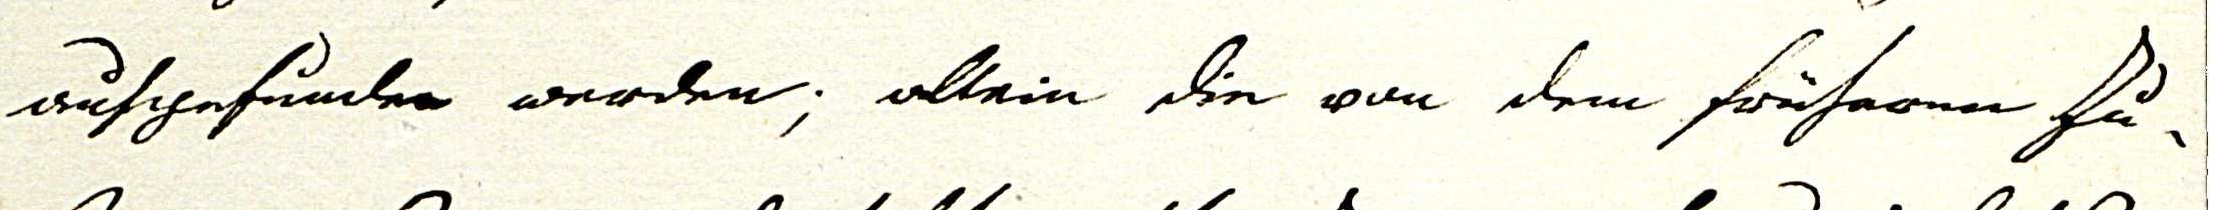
aufgefunden werden; allein die von dem früheren Ju¬
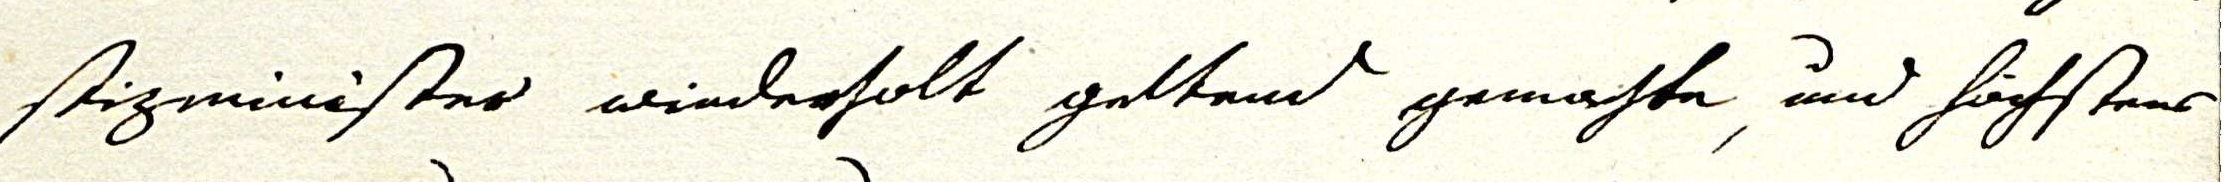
stizminister wiederholt geltend gemachte, und höchstens
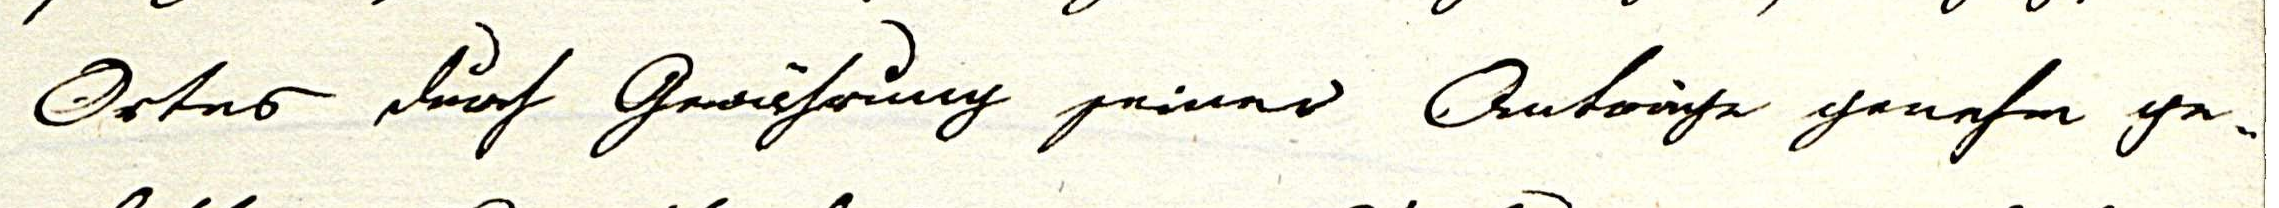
Ortes durch Gewährung seiner Anträge geruhen ge¬
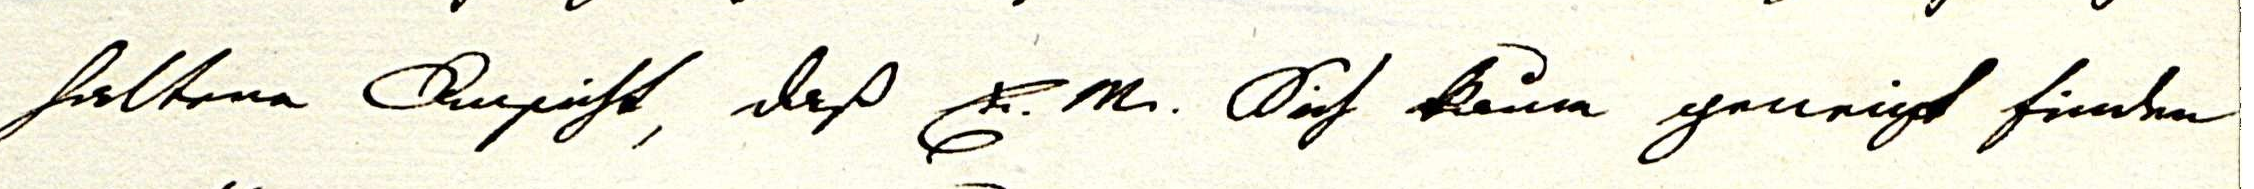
haltene Ansicht, daß E.M. Sich kaum geneigt finden
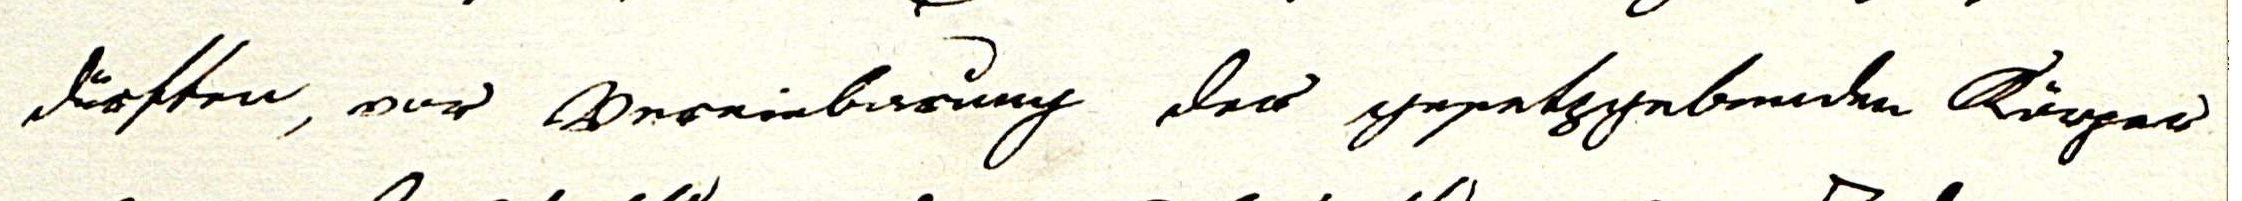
dürften, vor Vereinbarung der gesetzgebenden Körper
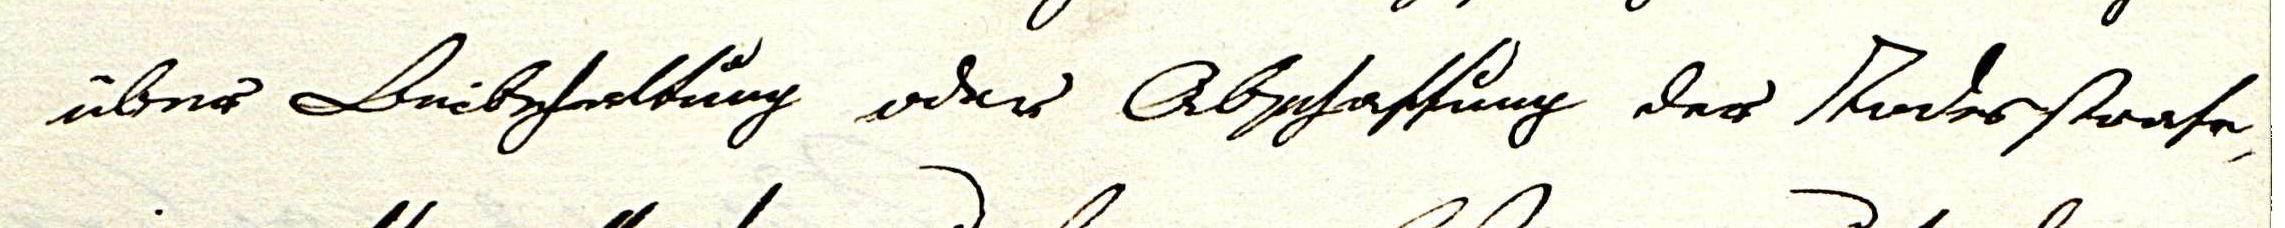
über Beibehaltung oder Abschaffung der Todesstrafe,
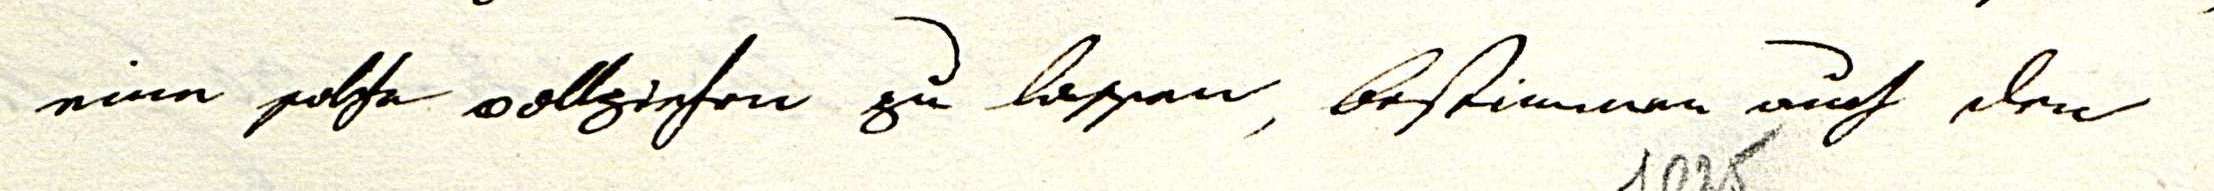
eine solche vollziehen zu lassen, bestimmen auch den
